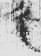帀（師）
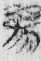○（陽）
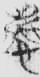慶
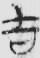吉
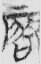啓
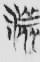漾
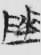陵
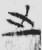之
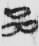厽（參）
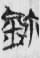鉨
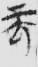而
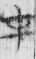才（在）
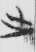之
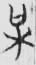某
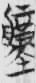瘽
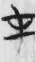才（在）
